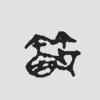築
